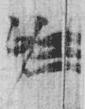於
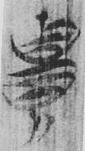貴
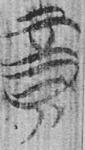○（富）
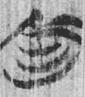戶
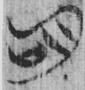名（銘）
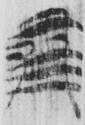隹（唯）
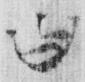曰
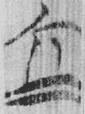立（位）
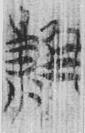難
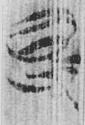𠭁
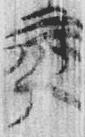而
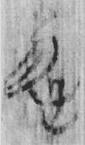愓（易）
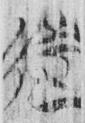○（失）
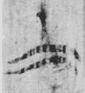士
